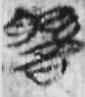䌛
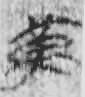黃
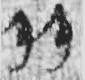偶
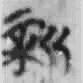新
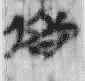俈
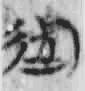○（卜）
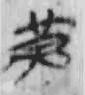黃
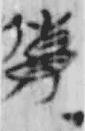儥
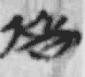俈
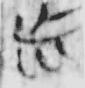巟
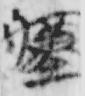瘽
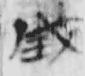城
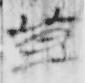莫
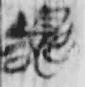囂
